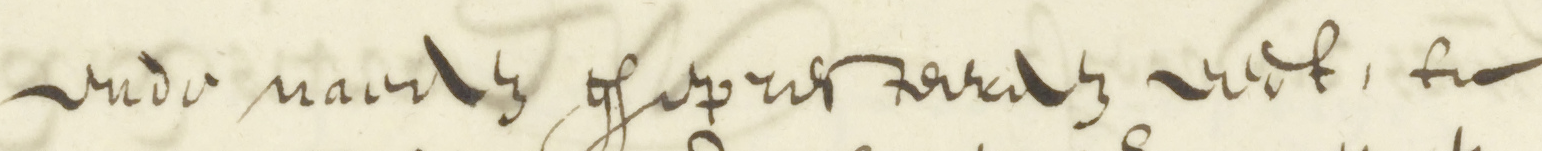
ende naerden ghepresteerden eedt, te
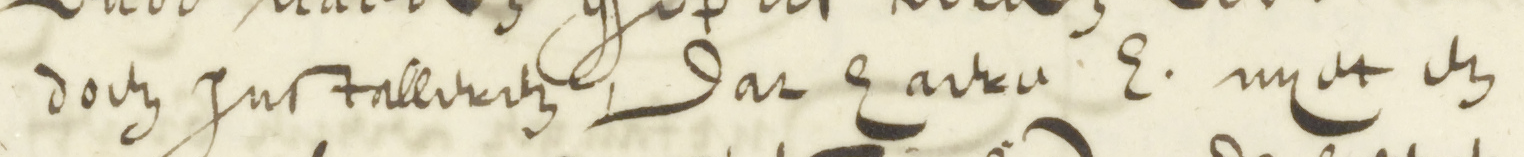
doen installeren, daer haere E. nyet en
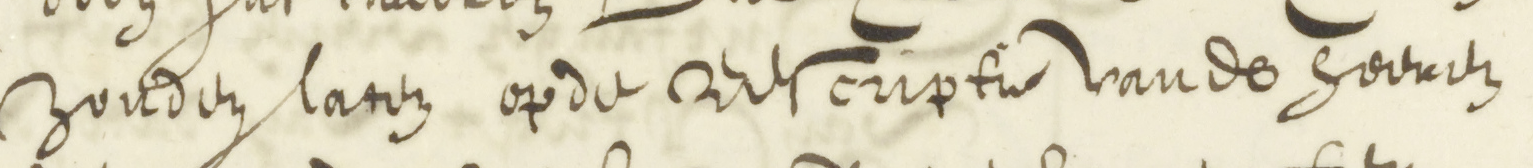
zouden laten opde rescriptie vande heeren
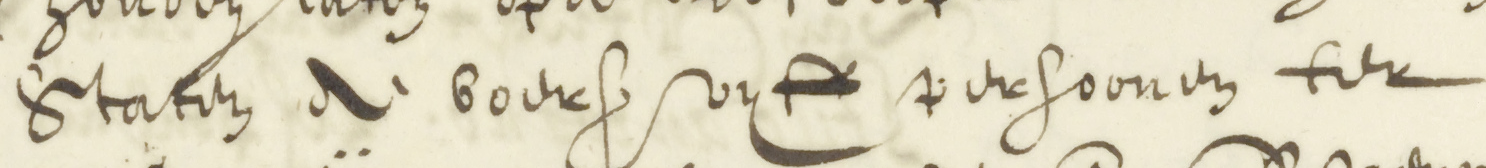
Staten de voors vyf persoonen ter
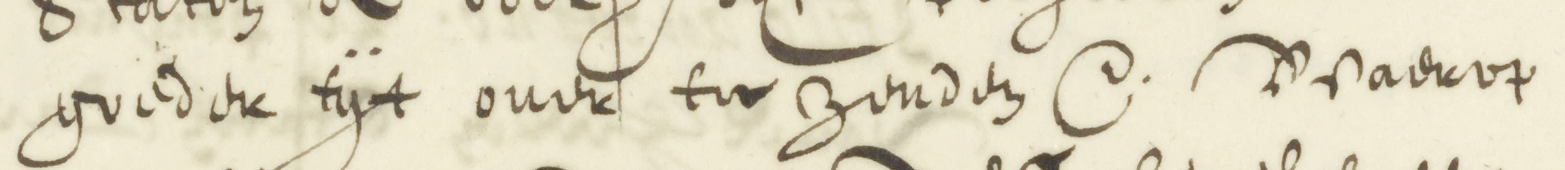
goeder tijt ouer te zenden C. Waerop
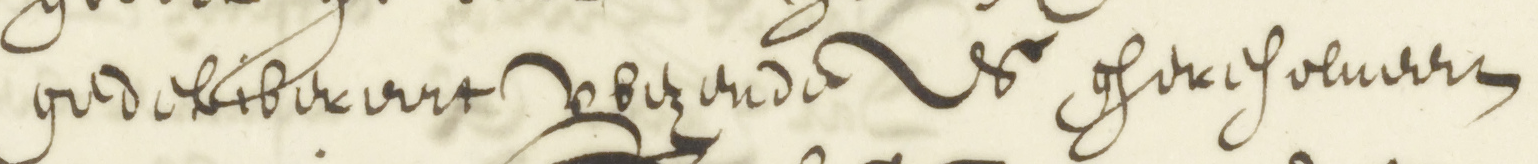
gedelibereert wezende es gheresolueert
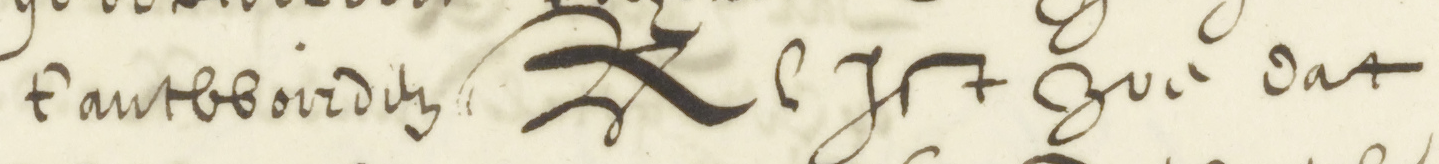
t'antwoirden: Al ist zoe dat
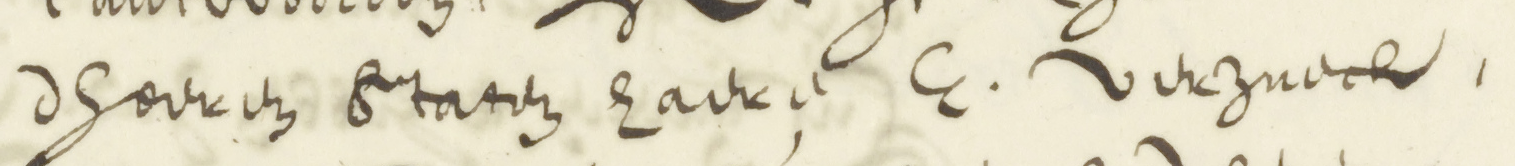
dheeren Staten haere E. verzueck,
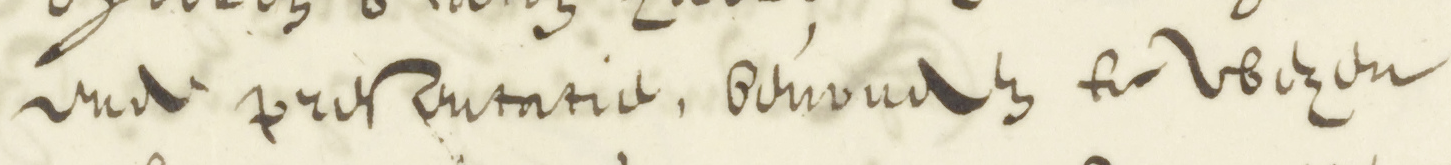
ende presentatie, beuonden te wezen
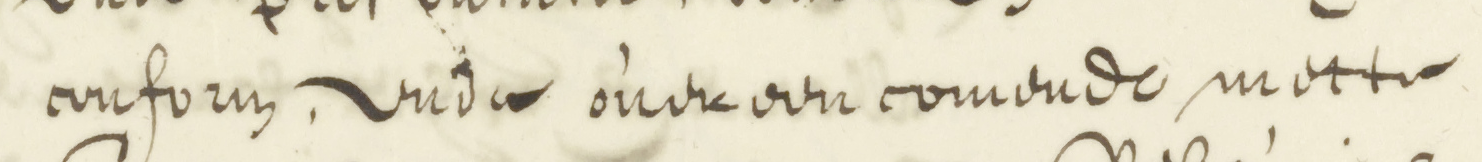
conform, ende ouer een comende mette
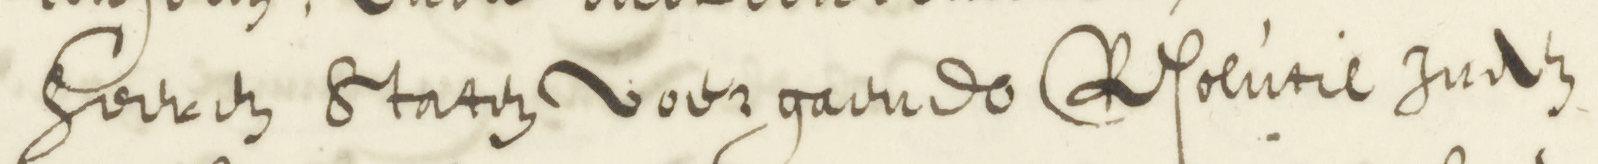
heeren Staten voergaende Resolutie inden
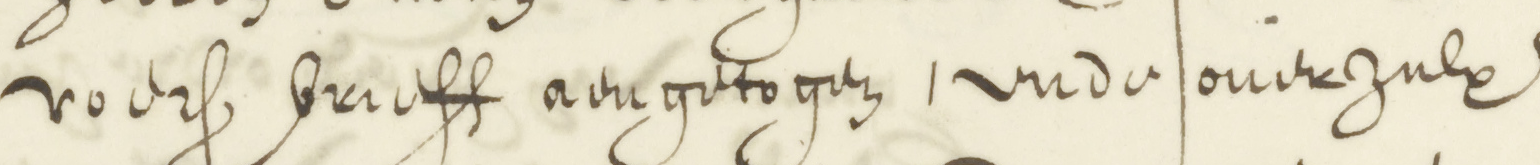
voors brieff aengetogen, ende ouerzulx
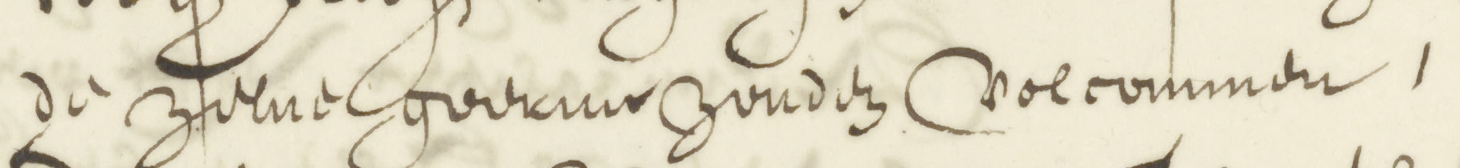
de zelve geerne zouden volcommen,
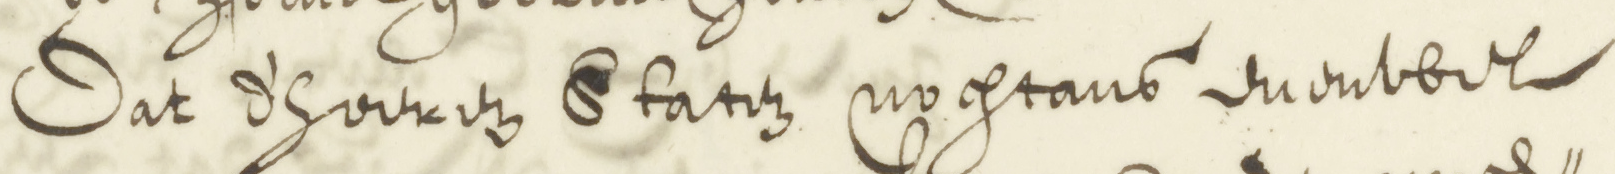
Dat d'heeren Staten nochtans euenwel
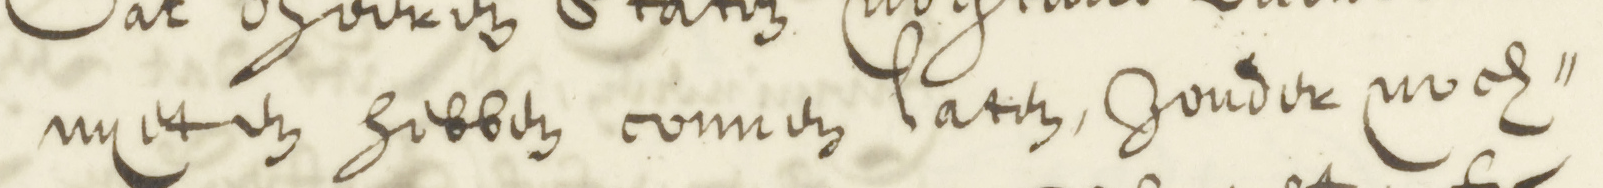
nyet en hebben connen laten, zonder noch„
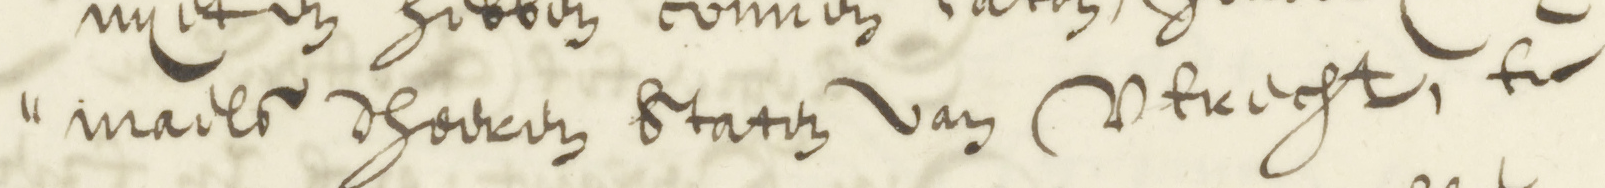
maels dheeren Staten van Utrecht, te
